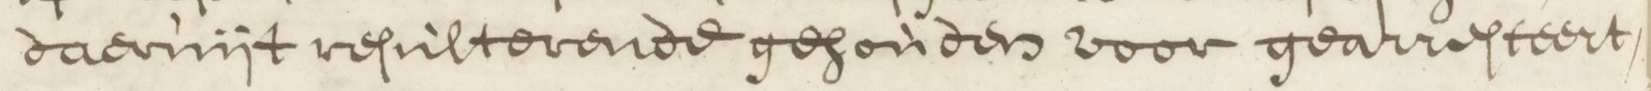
daeruijt resulterende gehouden voor gearresteert.
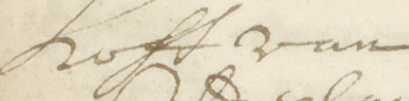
Hoff van
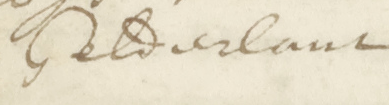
Gelderlant
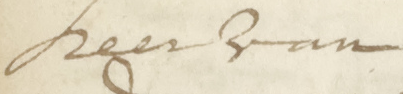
heer van
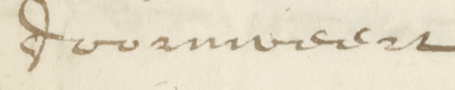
Doornweert
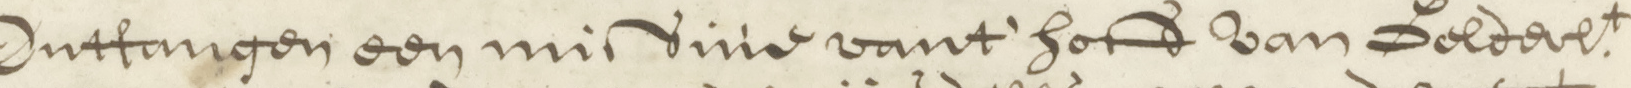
Ontfangen een missiue vant' hoff van Gelderlt.
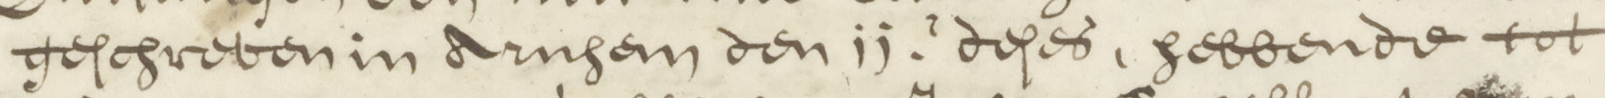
geschreven in Arnhem den 11e. deses, hebbende tot
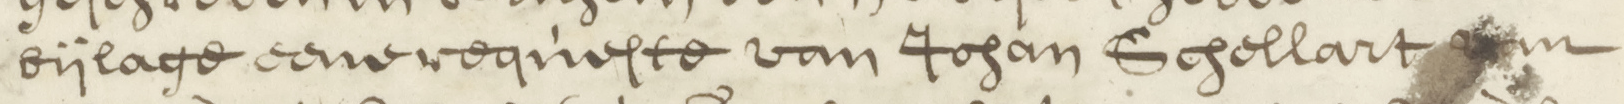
bijlage eene requeste van Johan Schellart van
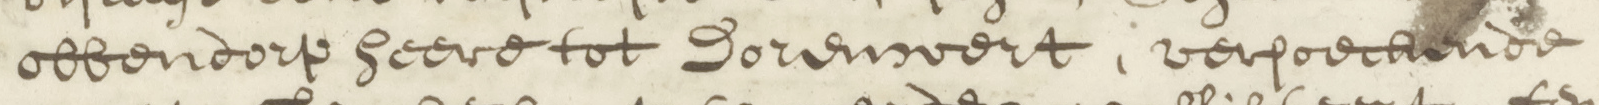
obbendorp heere tot Dorenwert, versoeckende
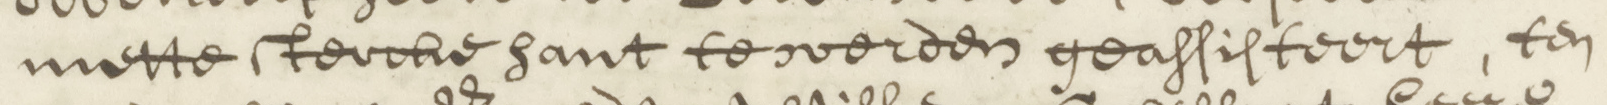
mette stercke hant te werden geassisteert, ten
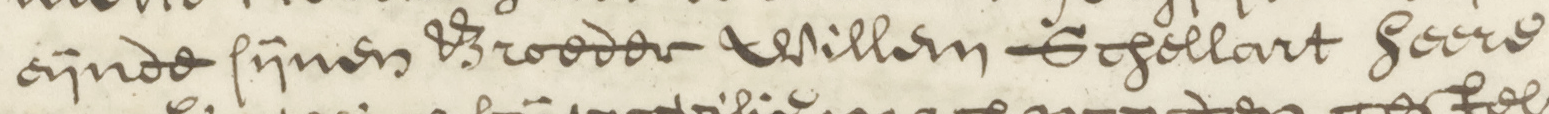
eijnde sijnen Broeder Willem Schellart heere
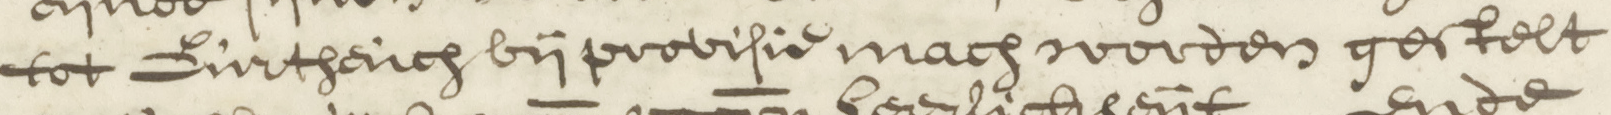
tot Gurtheuch bij provisie mach worden gestelt
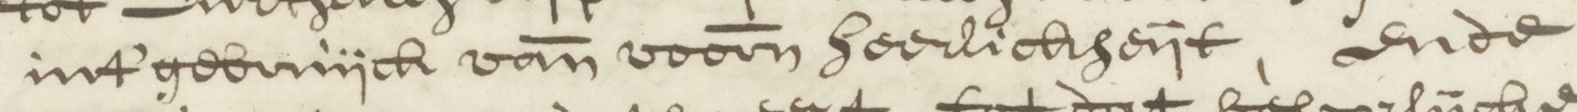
int' gebruijck van voorn heerlickheijt, ende
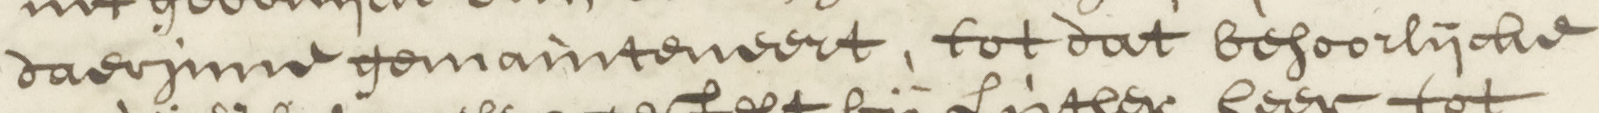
daerinne gemainteneert, tot dat behoorlijcke
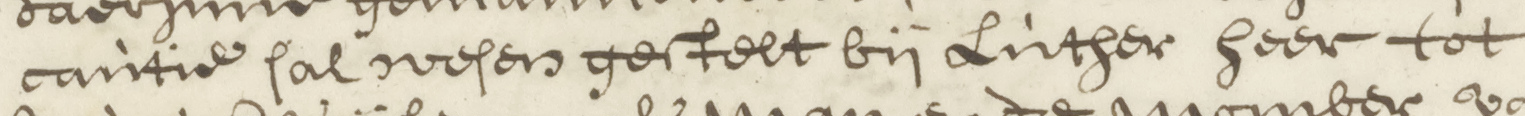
cautie sal wesen gestelt bij Luther heer tot
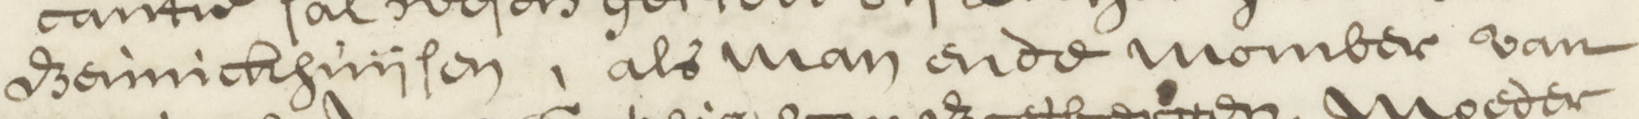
Beunickhuijsen, als man ende momber van
